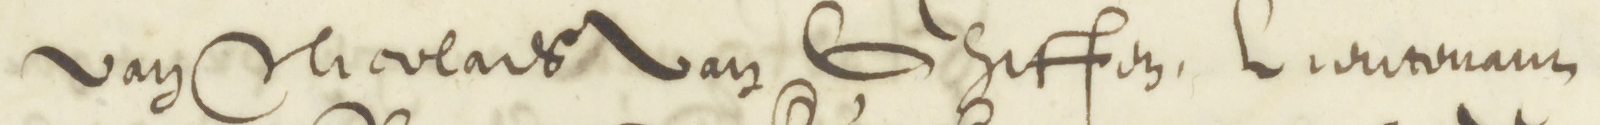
van Nicolaes van Ghiffen, Lieutenant
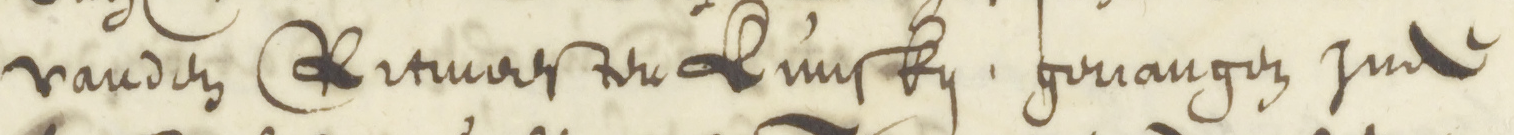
vanden Ritmeester Kunsky, gevangen Inde
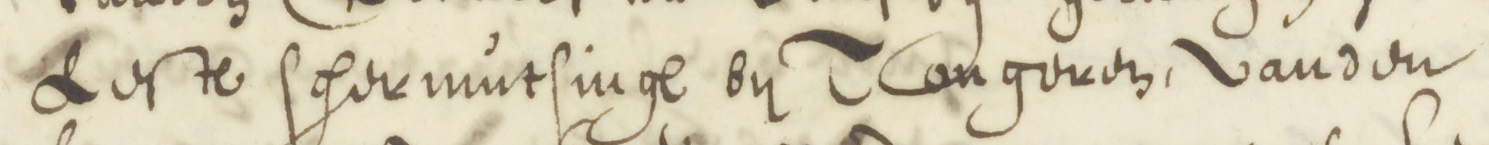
leste schermutsinge bij Tongeren, vanden
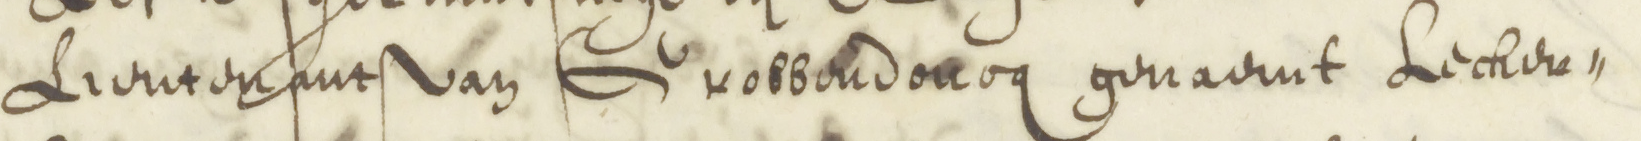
Lieutenant van Grobbendoncq, genaemt Lecker„
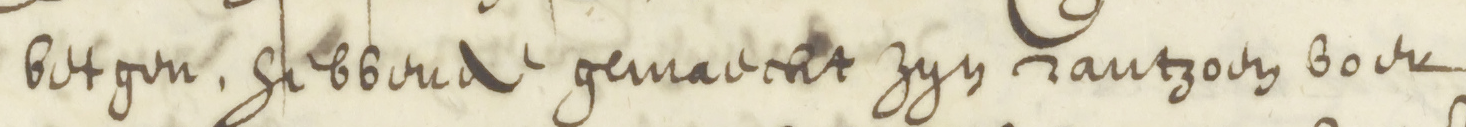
betgen, hebbende gemaeckt zyn rantzoen voer
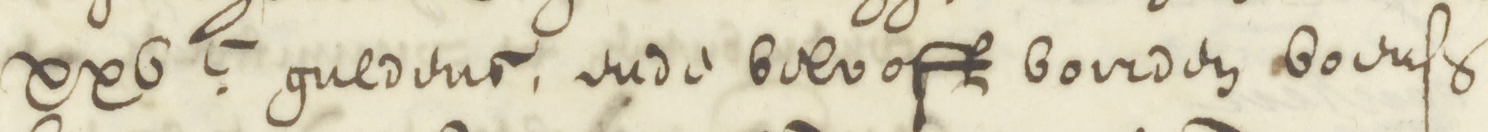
XXVC. guldens, ende belooft voirden voers
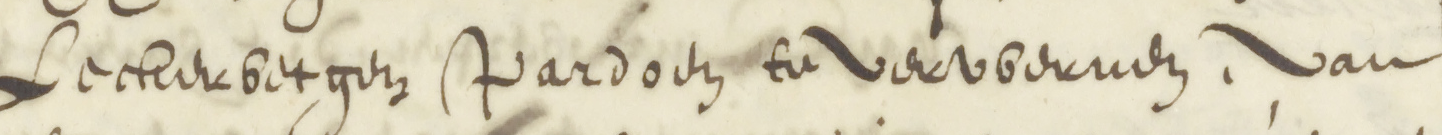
Leckerbetgen Pardoen te verwerven, van
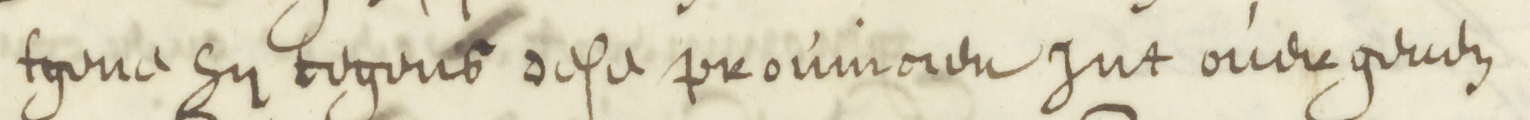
tgene hy tegens dese prouincien int ouergeven
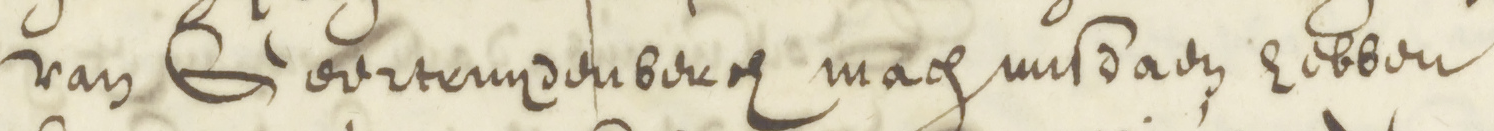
van Geertruydenberch mach misdaen hebben
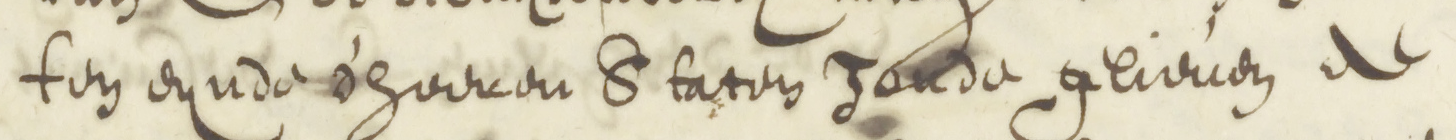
ten eynde d‛heeren Staten zoude gelieven de
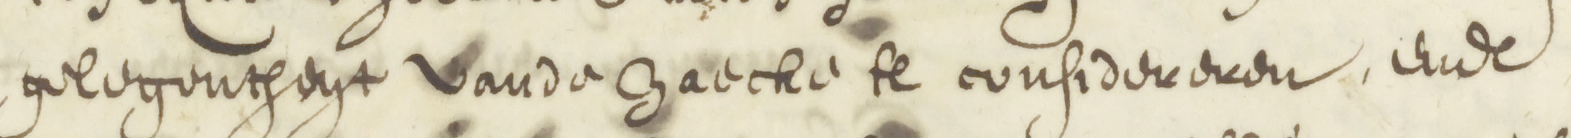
gelegentheyt vande zaecke te considereren, ende
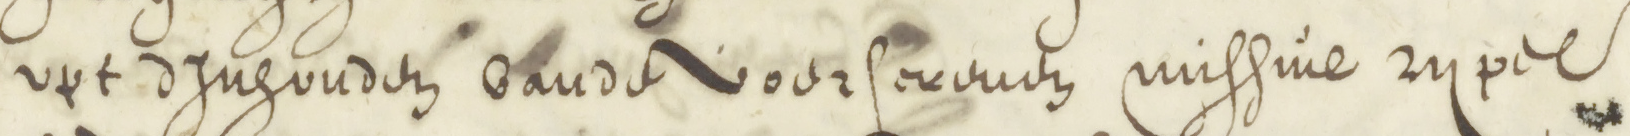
opt dInhouden vande voerscreven missive rypel
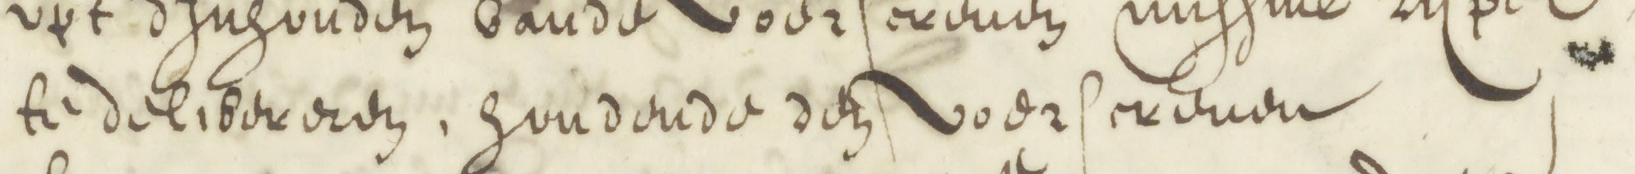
te delibereren, houdende den voerscreven
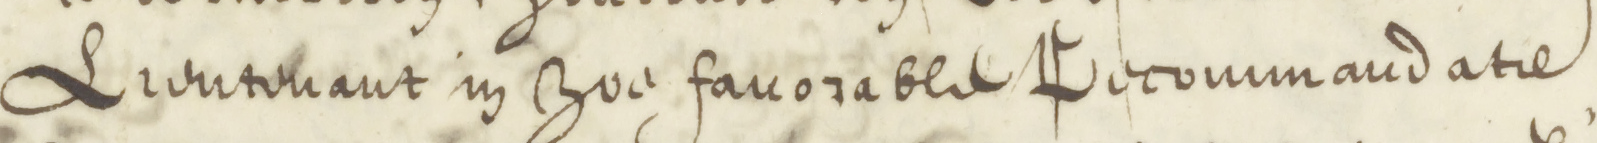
Lieutenant in zoe favorable Recommandatie
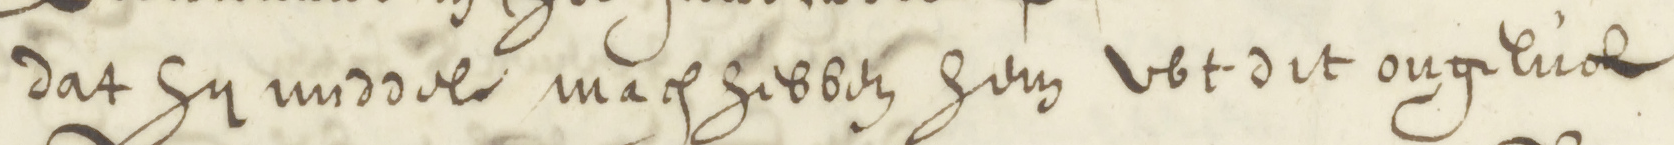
dat hy middel mach hebben hem wt dit ongeluck
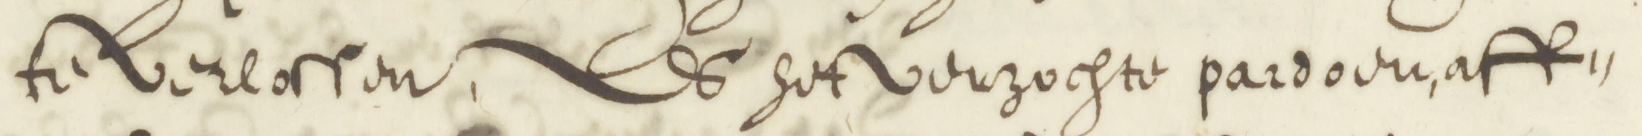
te verlossen. Es het verzochte pardoen, aff„
